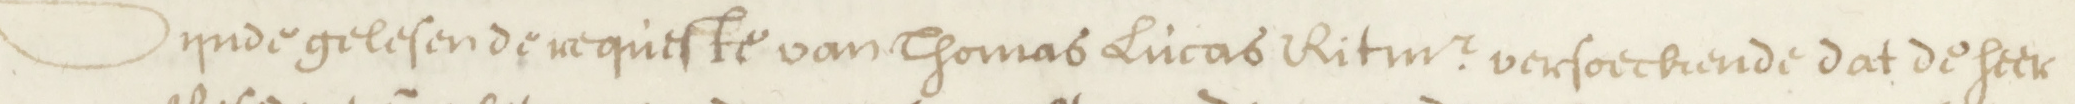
Synde gelesen de requeste van Thomas Lucas Ritmr. versoeckende dat de heer
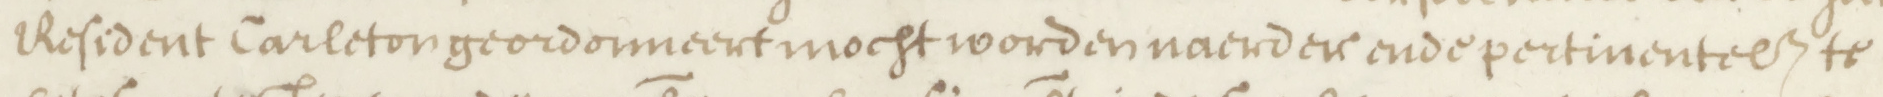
Resident Carleton geordonneert mocht worden naerder ende pertinentel te
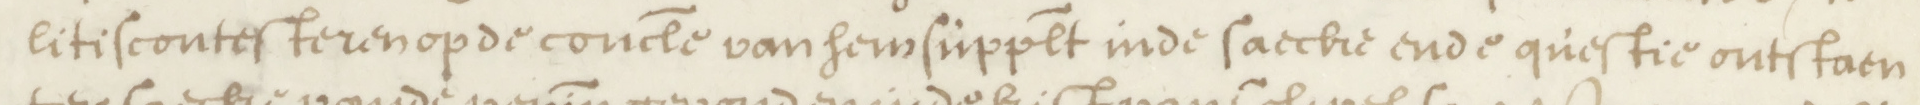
litiscontesteren op de concle van hem supplt inde saecke ende questie ontstaen
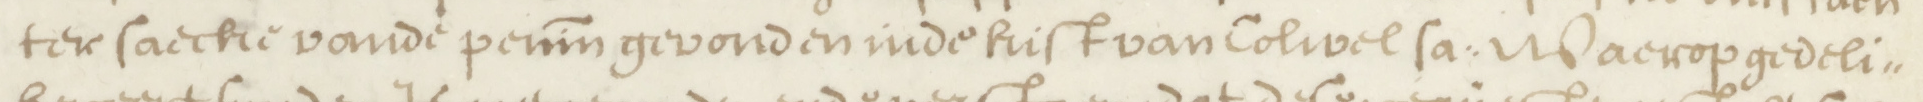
ter saecke vande penin gevonden inde kist van Colwel sa: Waerop gedeli„
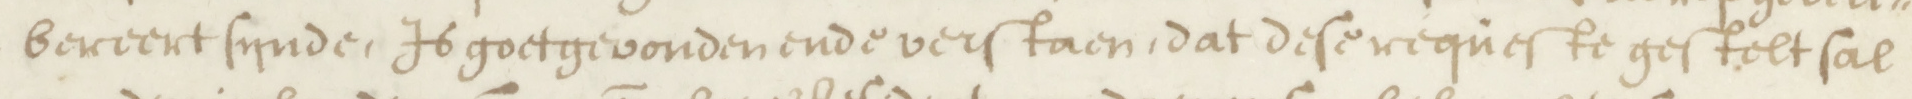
„bereert synde, Is goetgevonden ende verstaen, dat dese requeste gestelt sal
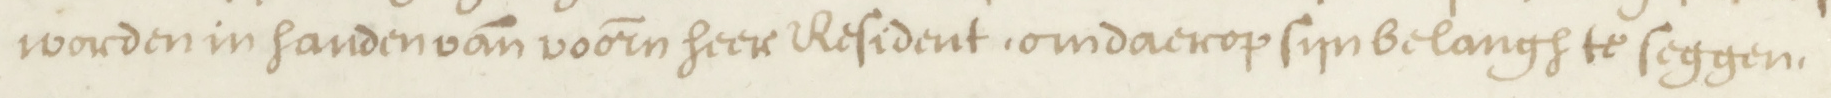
worden in handen van voorn heer Resident, om daerop syn belangh te seggen.
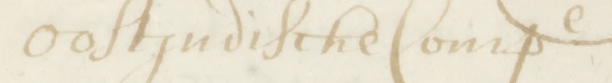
Oostindische Compe
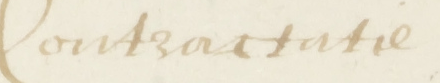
Contractatie
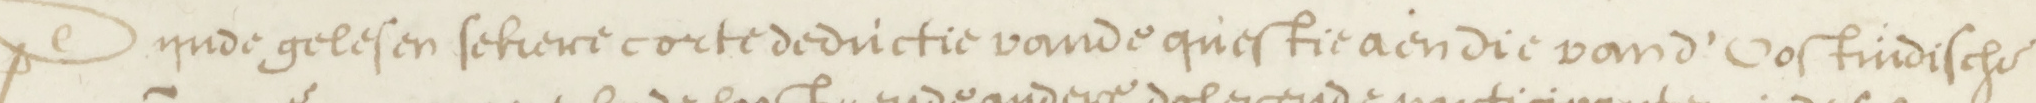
Synde gelesen sekere corte deductie vande questie aen die vand' Oostindische
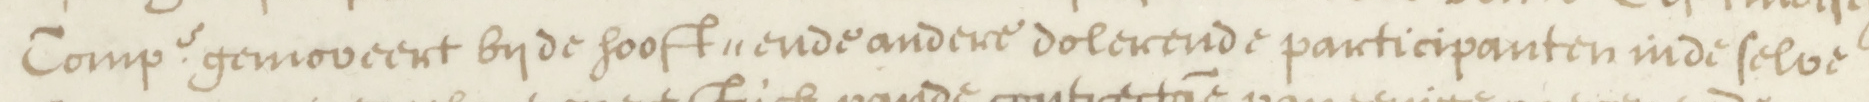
Compe. gemoveert bij de hooft,, ende andere dolerende participanten in de selve
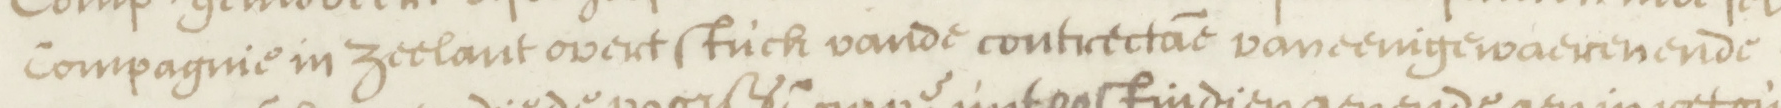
Compagnie in Zeelant overt stuck vande contrectae van eenige waeren ende —
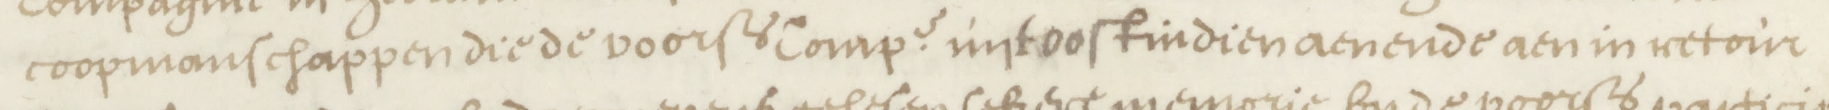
coopmanschappen die de voors Compe. uyt oostindien aen ende aen in retour
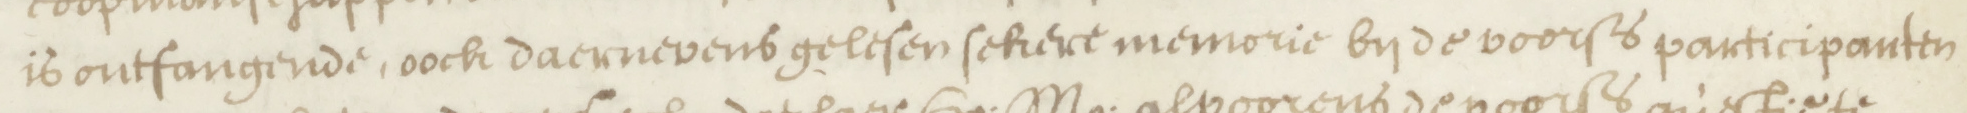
is ontfangende, oock daernevens gelesen sekere memorie by de voors participanten
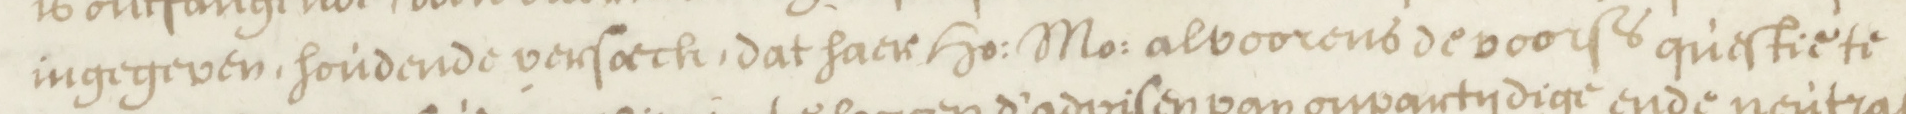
ingegeven, houdende versoeck, dat haer Ho:Mo: alvoorens de voors questie te
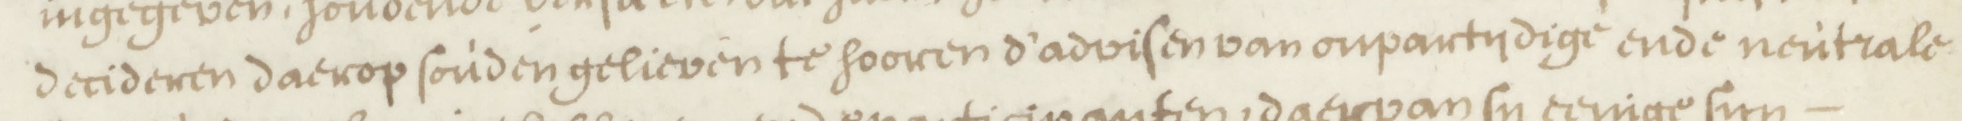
decideren daerop souden gelieven te hooren d'advisen van onpartydige ende neutrale
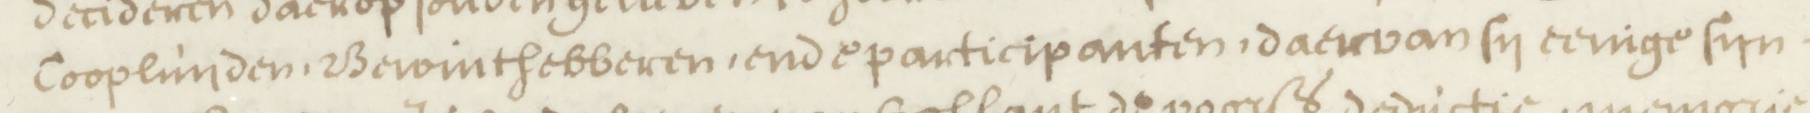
Coopluyden, Bewinthebberen, ende participanten, daervan sy eenige syn —
